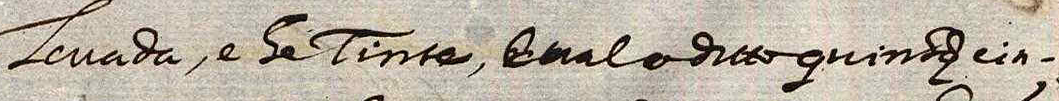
leuada, e he Tinte, e ual o ditto quinhão cin
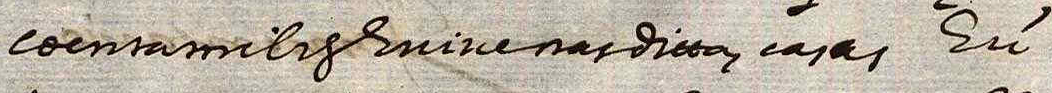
coenta mil rs E uiue nas dittas casas hū
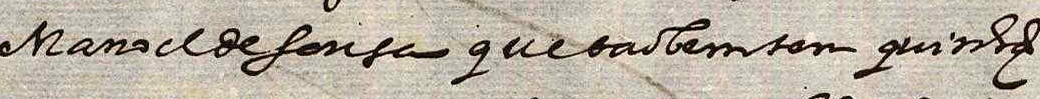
Manoel de sousa que taõbem tem quinhaõ
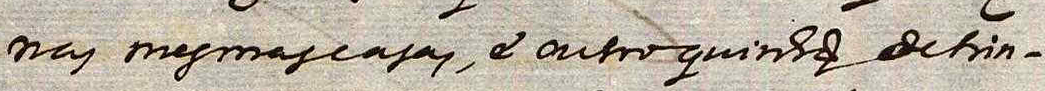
nas mesmas casas, e outro quinhaõ de trin
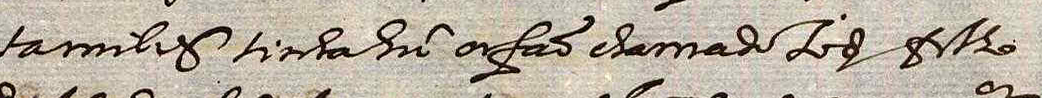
ta mil rs tinha hū orfaõ chamado Ioão filho
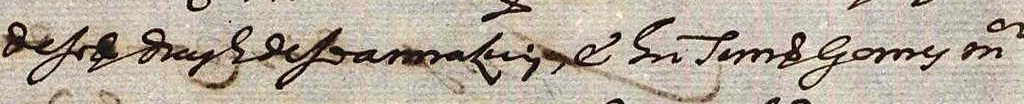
de João dias E de Joanna Luis, e hū simão Gomes mor
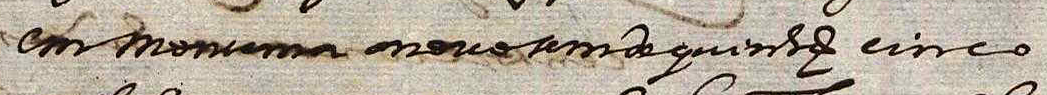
em montemor o nouo tem de quinhão cinco
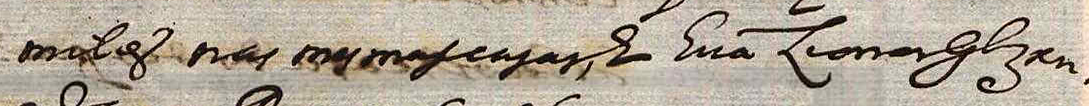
mil rs nas mesmas casas, E huā Leonor Glz xn
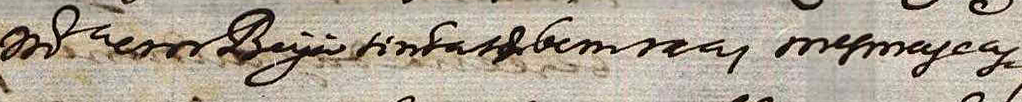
mra em Beija tinha tãobem nas mesmas casas
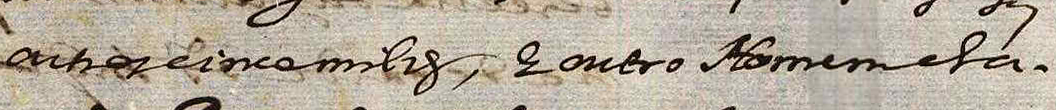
outros cinco mil rs, E outro Homem cha
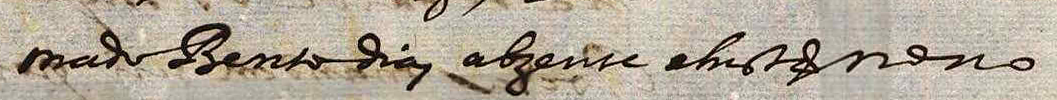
mado Bento dias abzente christaõ nouo
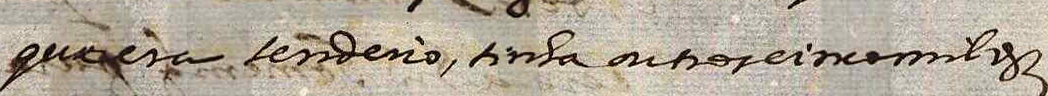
que era tendeiro, tinha outros cinco mil rs
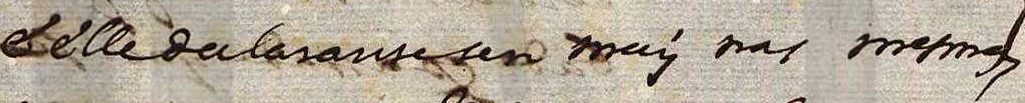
E elle declarante tem mais nas mesmas
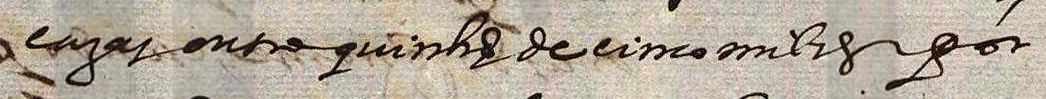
cazas outro quinhão de cinco mil rs por
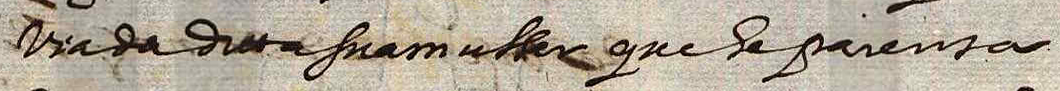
via da ditta sua mulher que he parenta
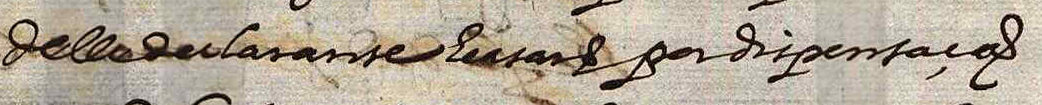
delle declarante E casaraõ por dispensaçaõ
